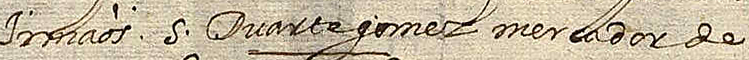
Irmaõs .s. Duarte gomez mercador de
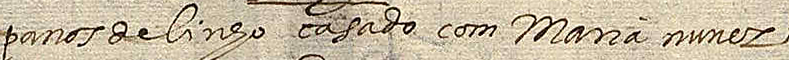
panos de linho casado com Maria nunez
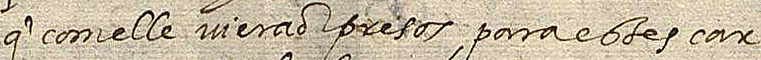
q̄ com elle uieraõ presos para estes car
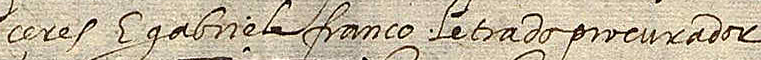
çeres E gabriel franco. Letrado procurador
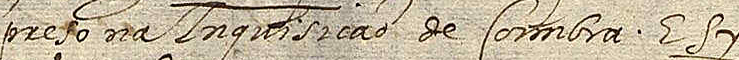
preso na Inquisicaõ de Coimbra. E Sy
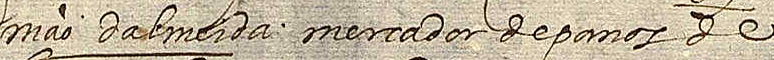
maõ dalmeida. mercador de panos de
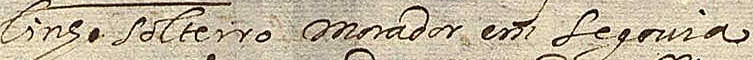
linho solteiro morador em Segouia
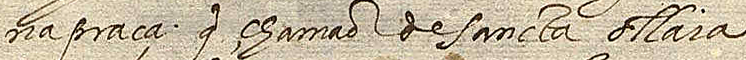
na praça. q̄ çhamaõ de Sancta ollaia
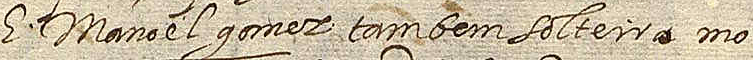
E Manoel gomez tambem solteiro mo
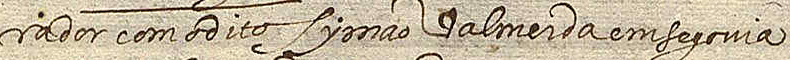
rador com o dito Symaõ dalmeida em segouia
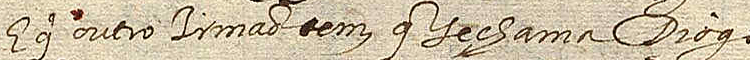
E q̄ outro Irmaõ tem, q̄ se çhama Diogo
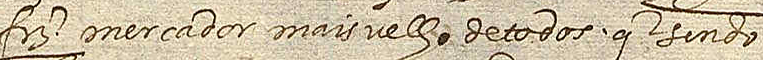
frz̄ mercador mais uelho de todos. q̄ sendo
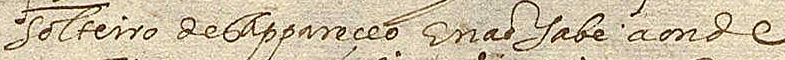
solteiro desappareçeo E naõ sabe aonde
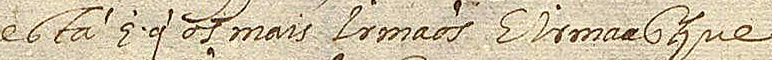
está E .q̄ os mais Irmaõs E Irmaas que
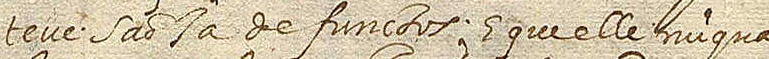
teue. saõ Ja defunctos E que elle nūqua
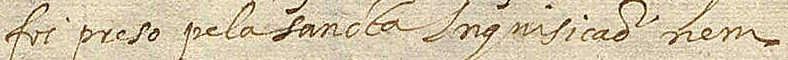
foi preso pela sancta Inquisicaõ nem
